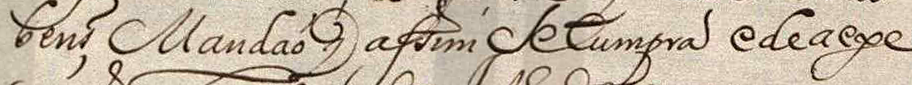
bens̄, Mandaõ q̄ assim Se Cumpra e de a exe
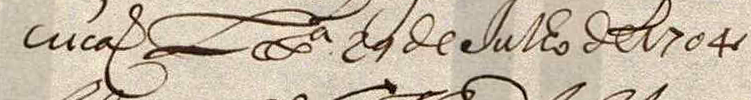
cuçaõ Lxa. 29 de Iulho de 1704
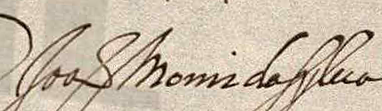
Joaõ Moniz da sylua
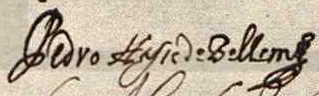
Pedro Hasse de Bellem
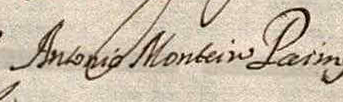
Antonio Monteiro Paim
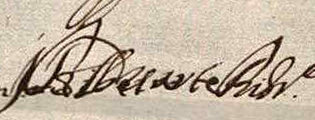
Joaõ Duarte Ribr.o
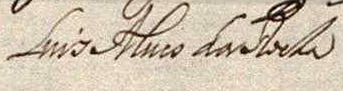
Luis Alues da Rocha
